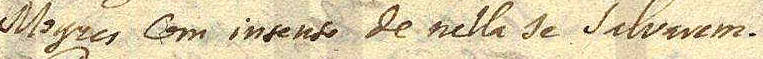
Moyzes Com intento de nella se Salvarem.
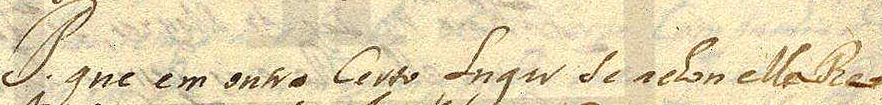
P. que em outro Certo Lugar Se achou ella Re
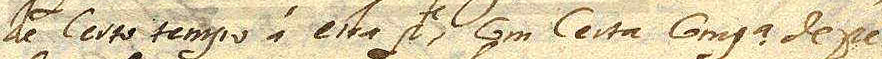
de Certo tempo á esta pte, com Certa Compa. de pe
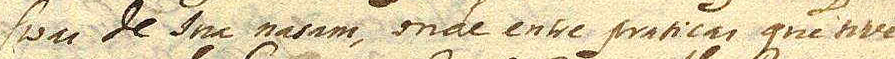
ssoas de sua nasam, onde entre praticas que tive
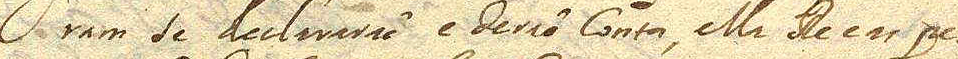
ram se declararaõ e deraõ Conta, ella Re e as pe
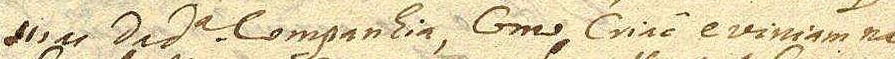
ssoas da da. Companhia, Como Criaõ e viviam na
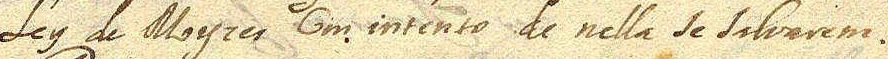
Ley de Moyzes Com intento de nella se Salvarem.
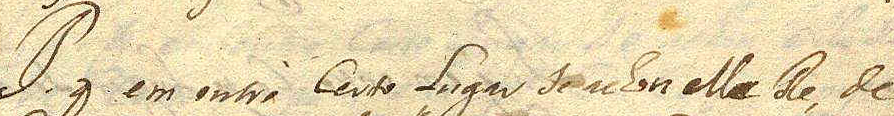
P. q̄ em outro Certo Lugar se achou ella Re, de
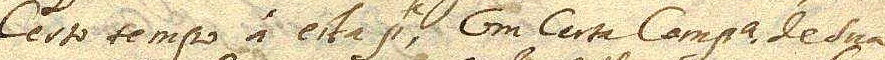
Certo tempo á esta pte, Com Certa Compa. de sua
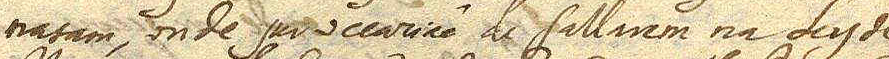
nasam, onde por occaziaõ de fallarem na Ley de
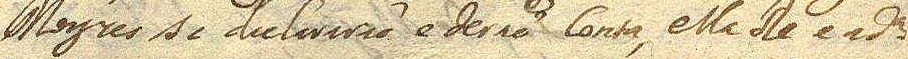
Moyzes se declararaõ e deraõ Conta, ella Re e a da.
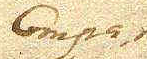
Compa.
